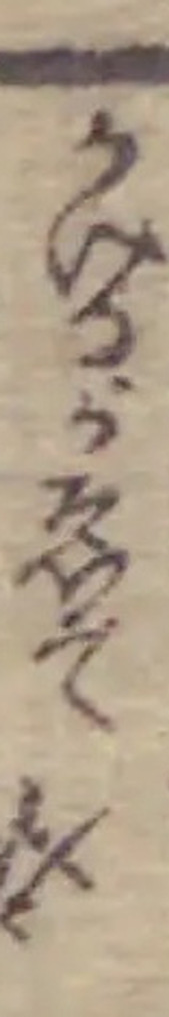かけるがたけて
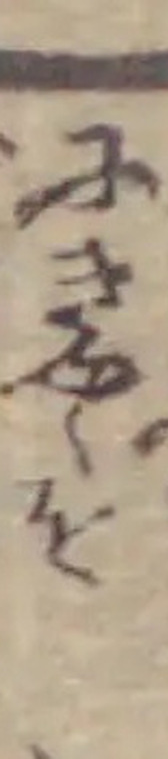にきやくを
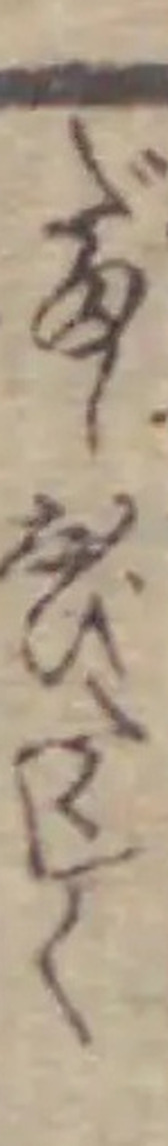だましおびたゝしく
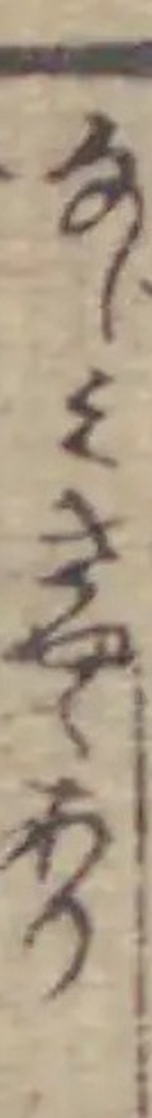なじみきやくあり
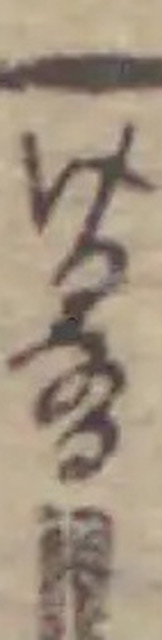けるなか
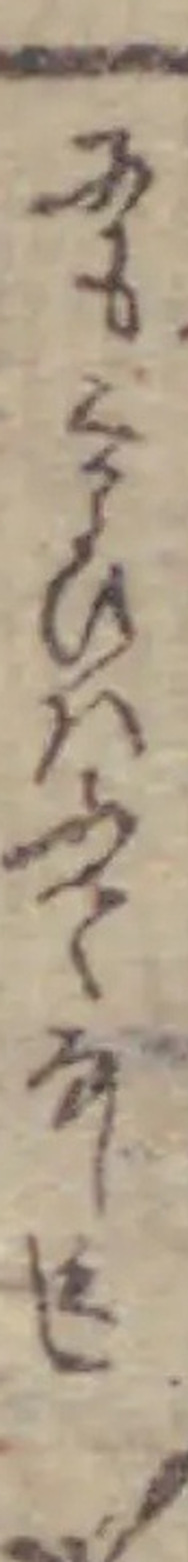にもひはふてなじみし
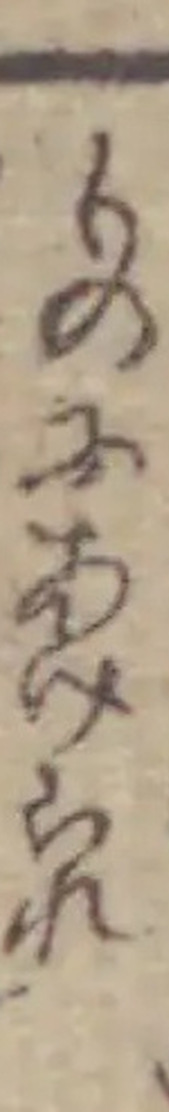ものにあけられ
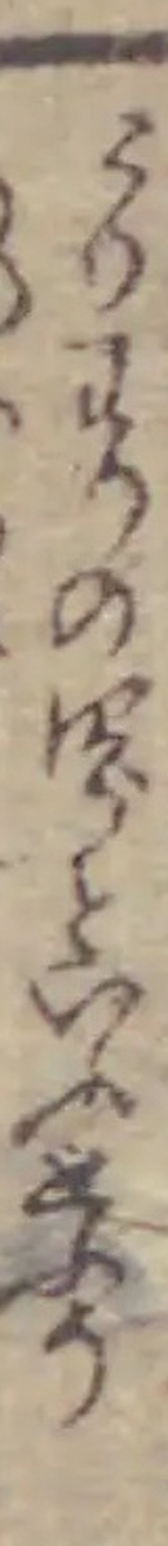うりわりの四郎といふとふり
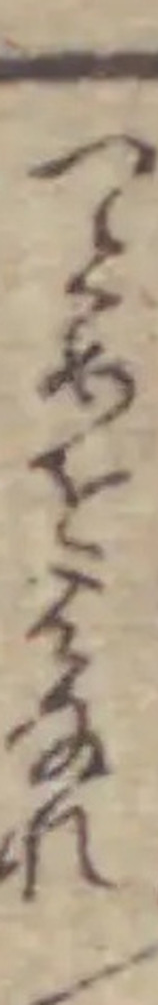つとめをはなれ
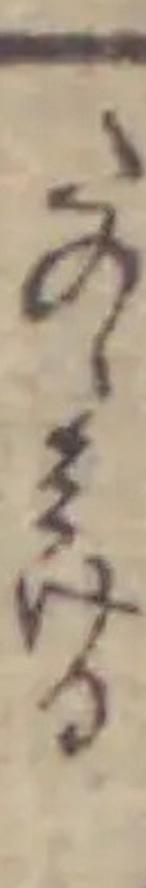たのしみける
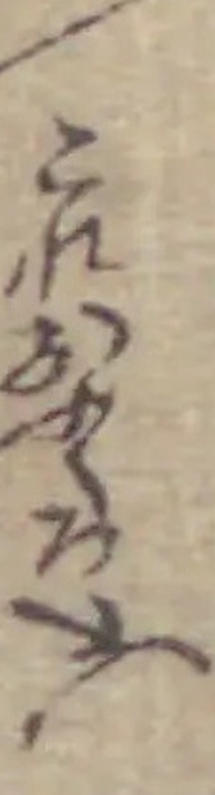これおふくろ
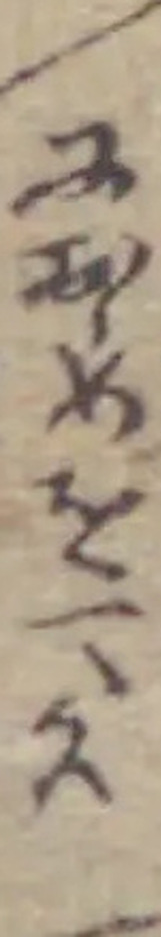におゝめを一たん
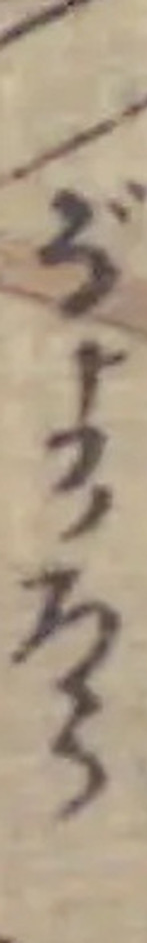がよかろう
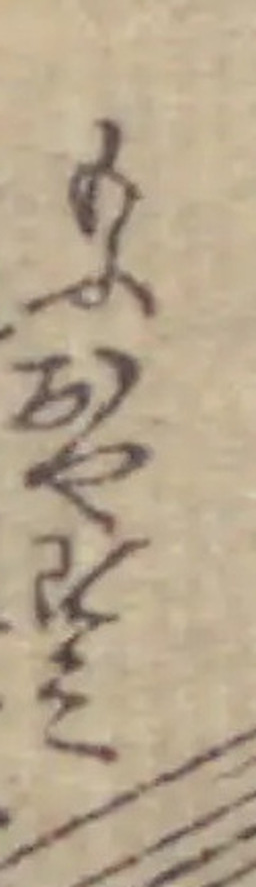もふおやすみ
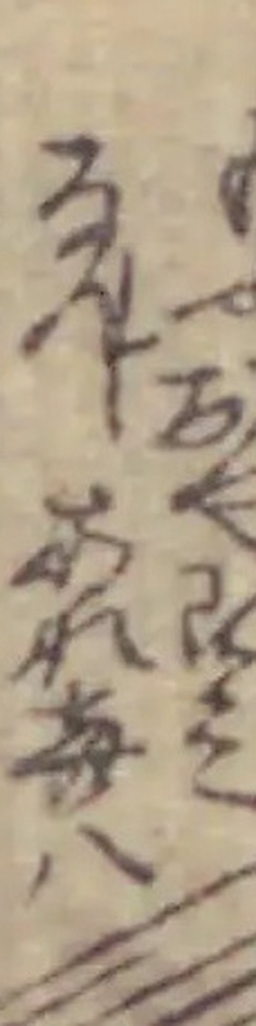なんしあれ喜八
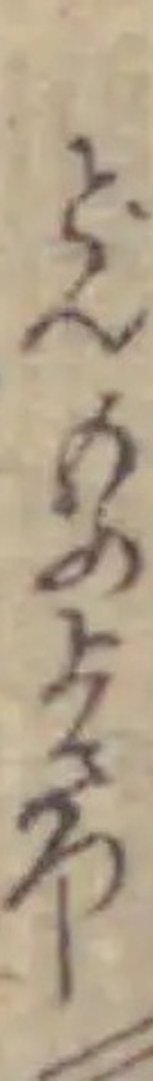どんもふよさつし
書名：奥州咄 3巻
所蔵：国立国会図書館 National Diet Library, JAPAN
